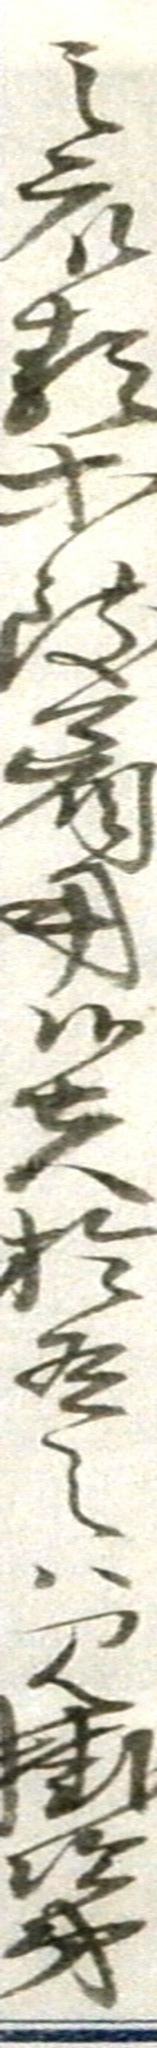之衣類等致着用候者於有之は見掛次第
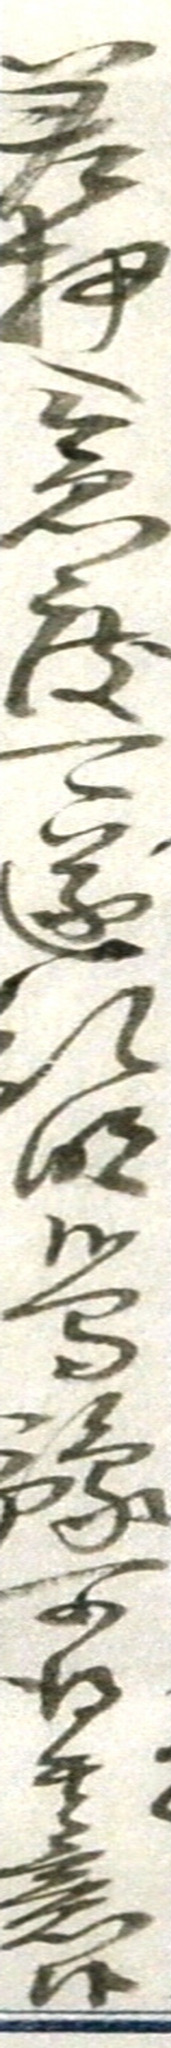差押へ急度可遂糾明候間予可得其意候
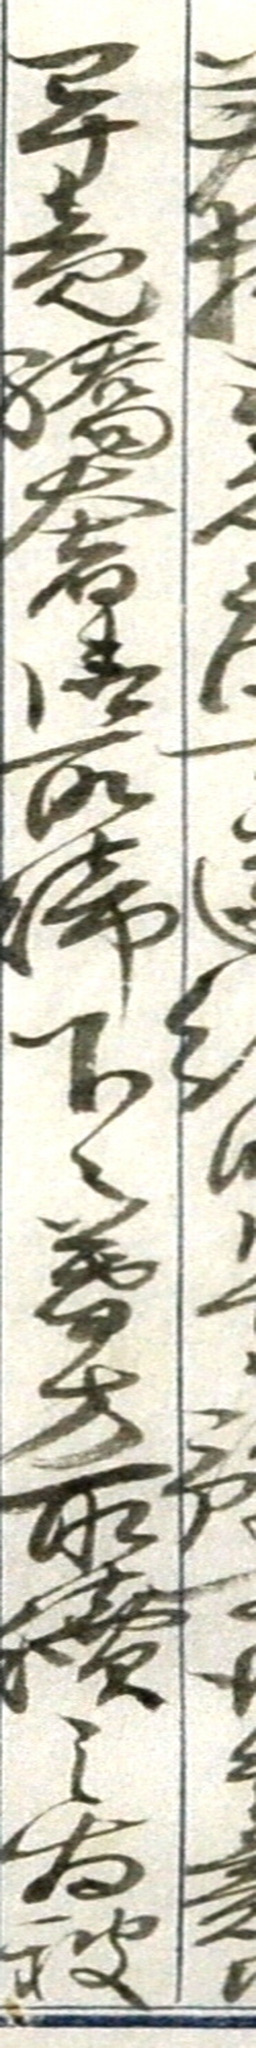畢竟驕奢御取締下々暮方取続之為被
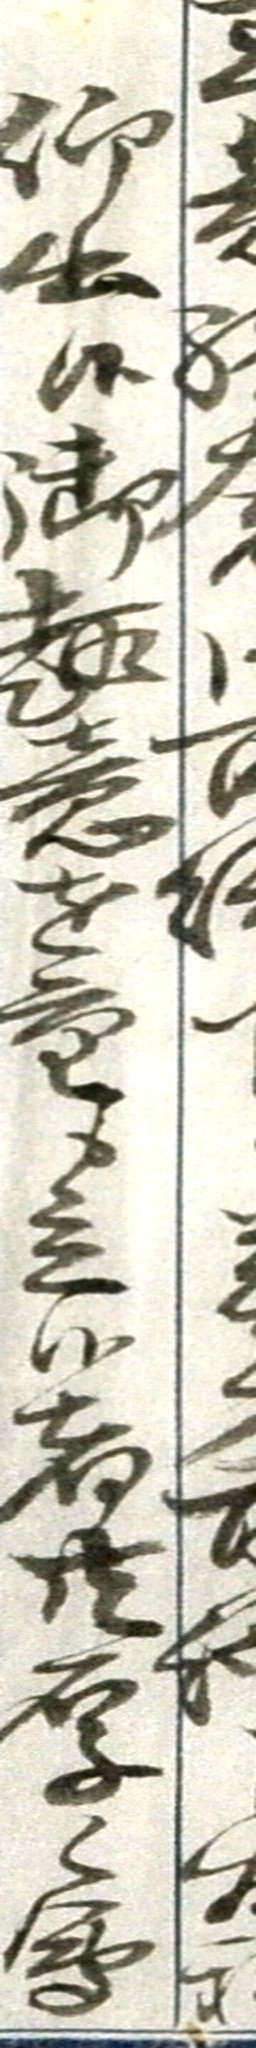仰出候御趣意を重も立候者共厚く会
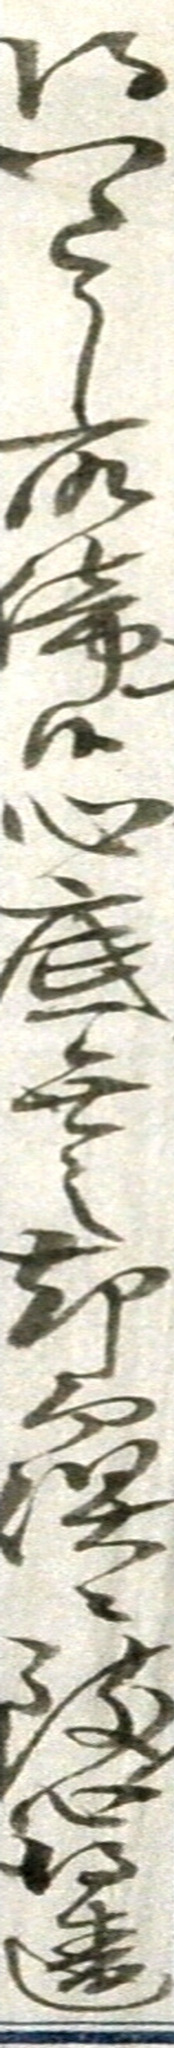得いたし取締候心底無之却而倶ニ致心得違
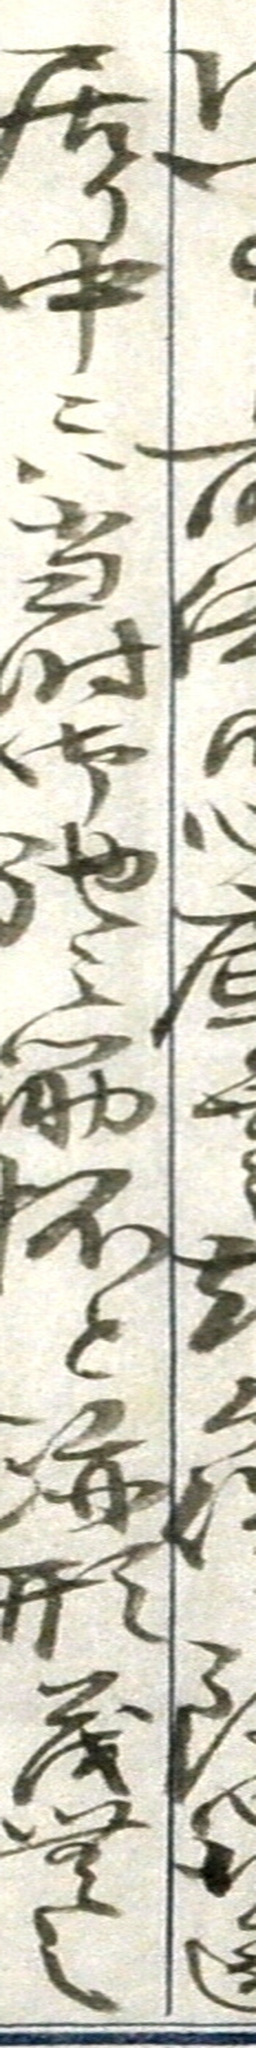居り中ニは当時御弛の筋抔と跡形茂無之
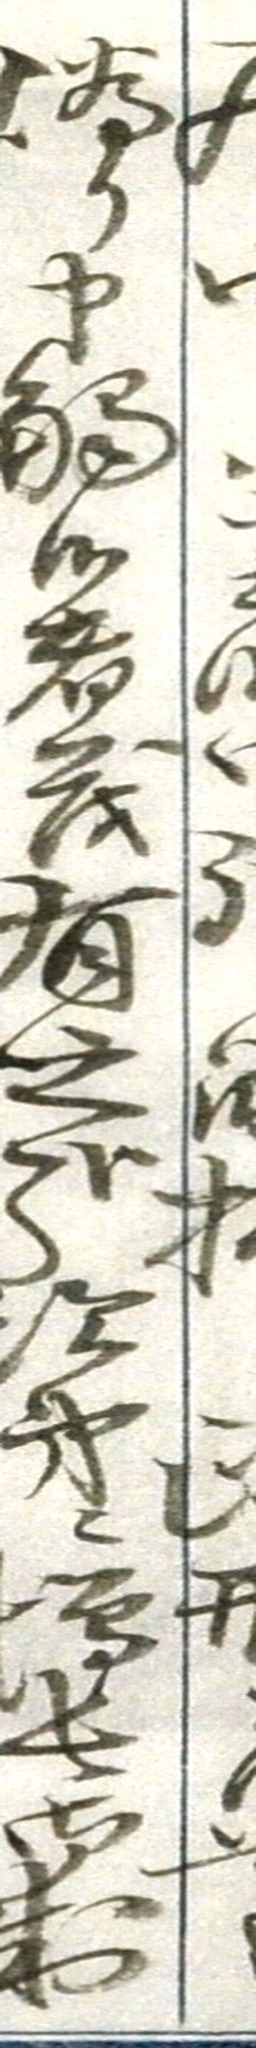偽り申触候者茂有之哉次第ニ増長御制
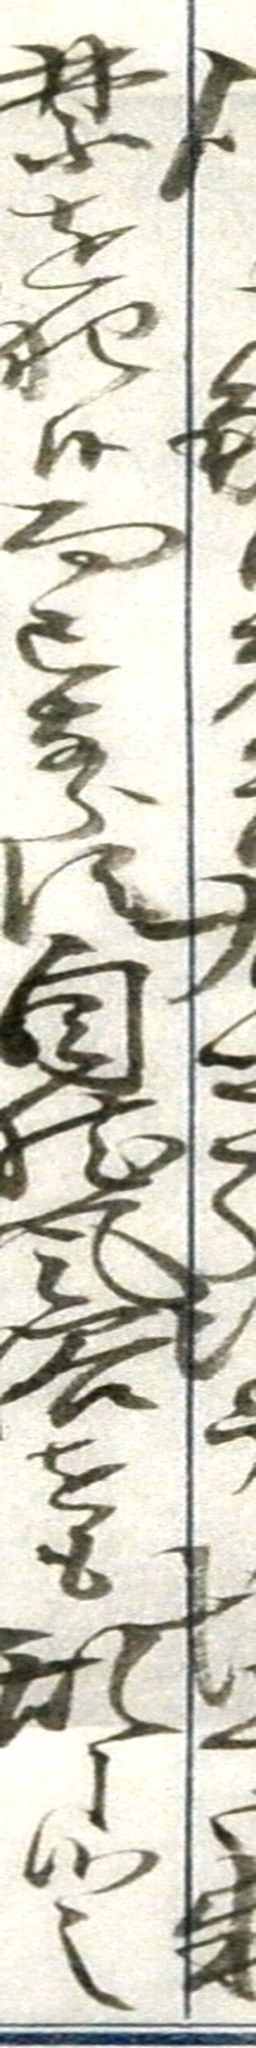禁を犯而已ならす自然風俗をも乱し候之
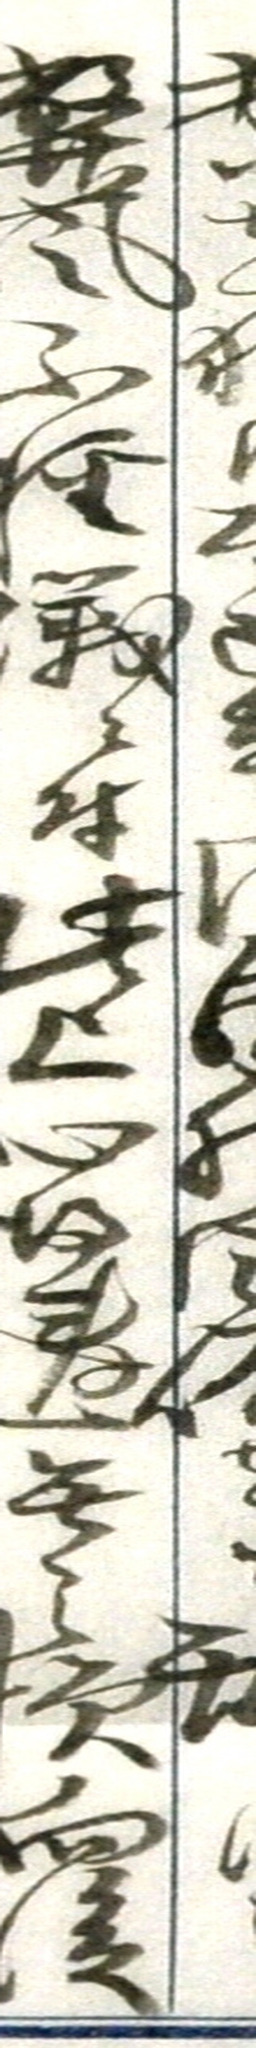弊風不軽儀ニ付此上心得違無之様向後
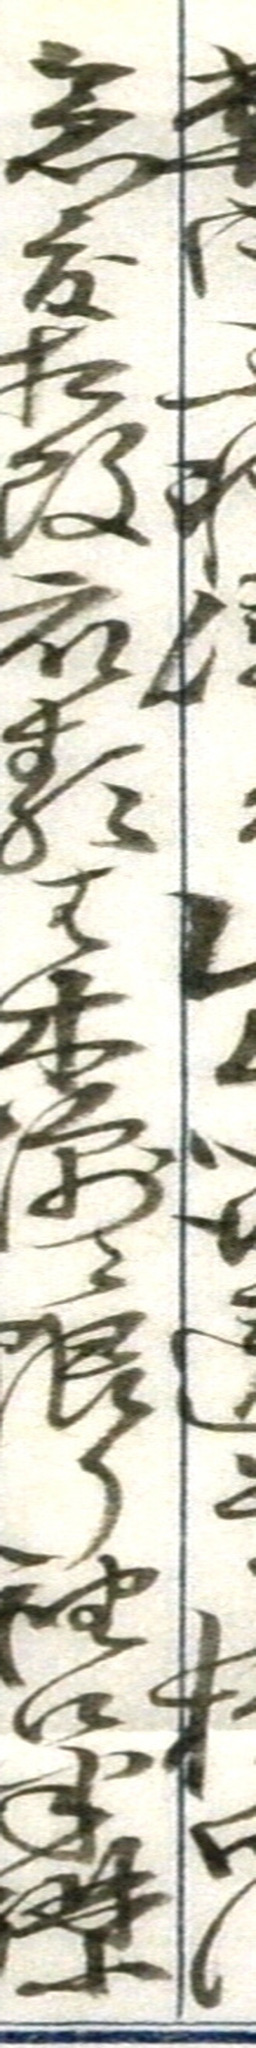急度相改衣類は木綿ニ限り袖口半襟
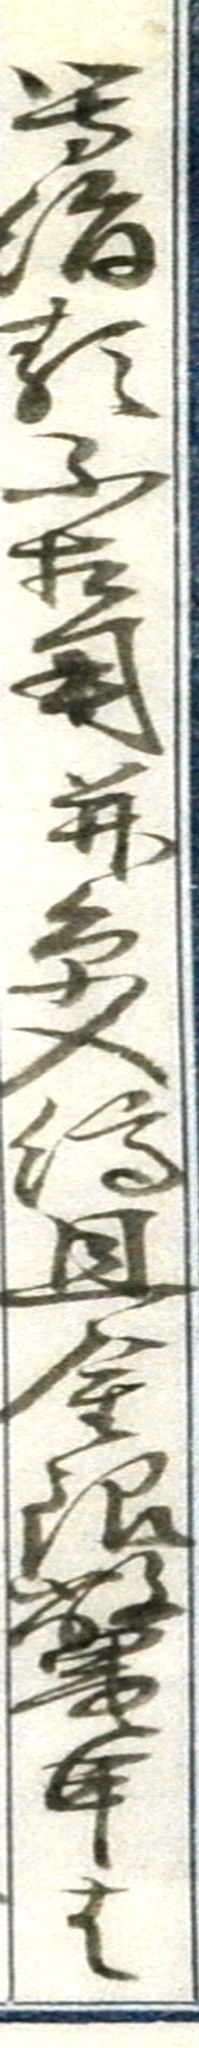等絹類不相用并糸入縞且金銀鼈甲は
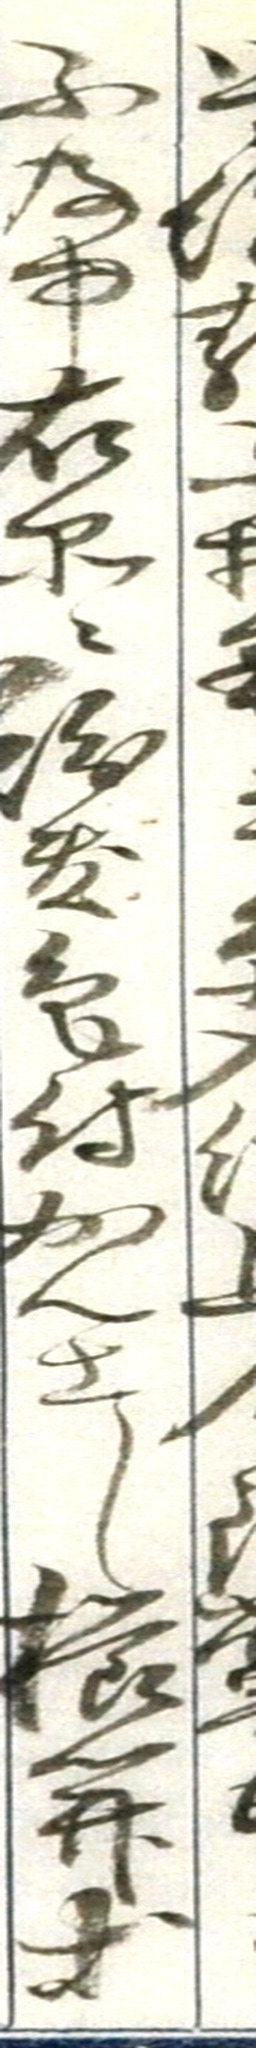不及申右品ニ紛敷色付かんさし櫛笄等
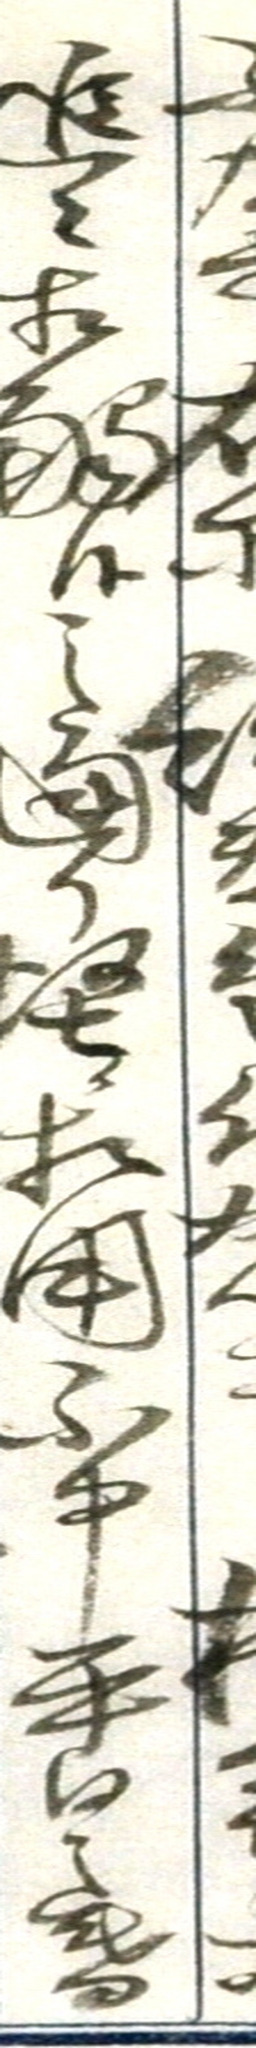追々相触候之通り堅ク相用不申平日之暮
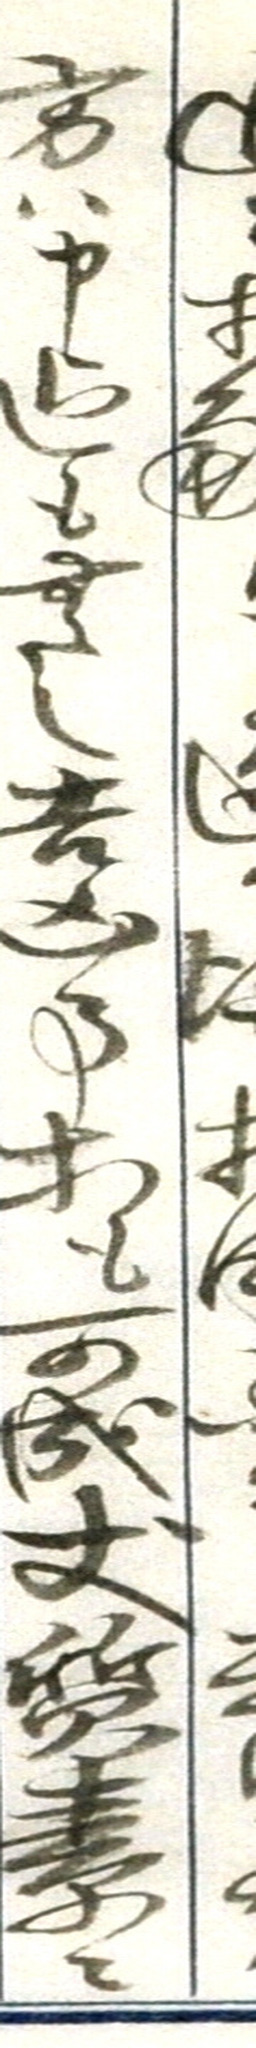方は申迄も無之吉凶事等も可成丈質素ニ
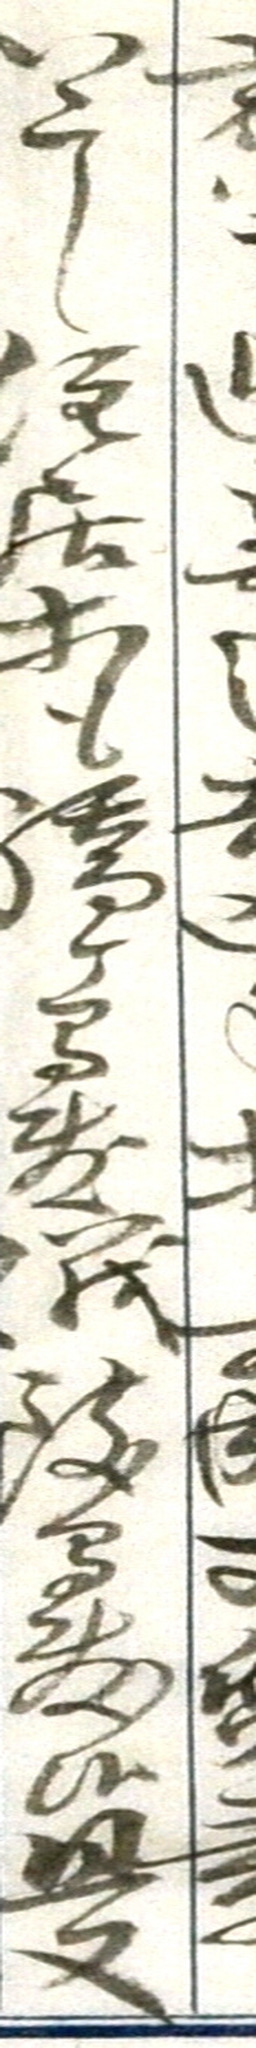いたし住居等も驕ケ間敷儀致間敷候且又
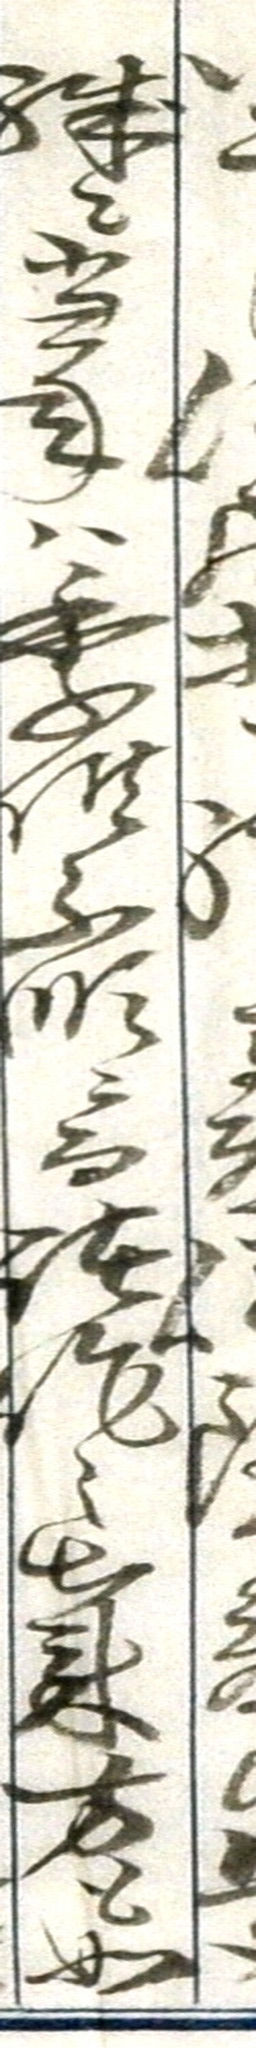殊に当年は気候不順にて諸作出来方も如
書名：御触書
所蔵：伊那市立高遠町図書館・合同会社AMANE
